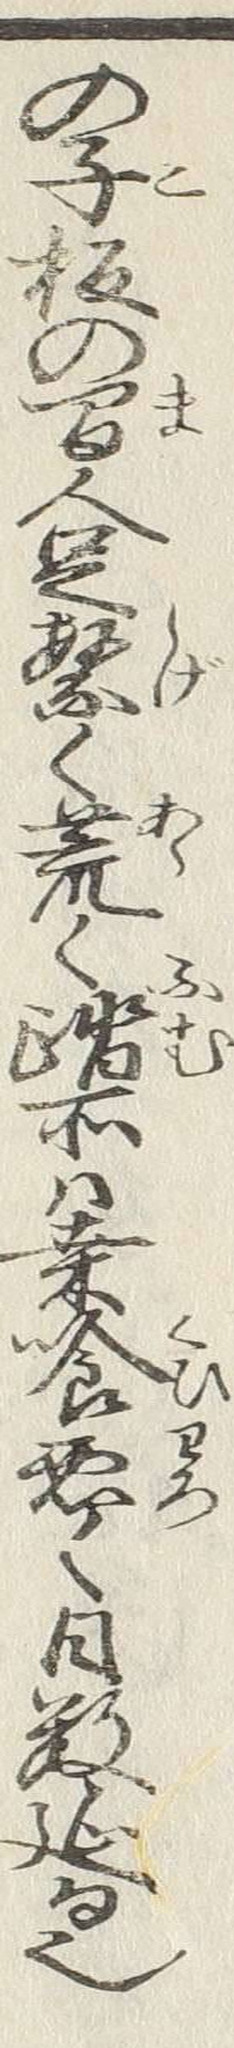の子板の間人足繁く荒く踏所は桒喰悪く日数延る也
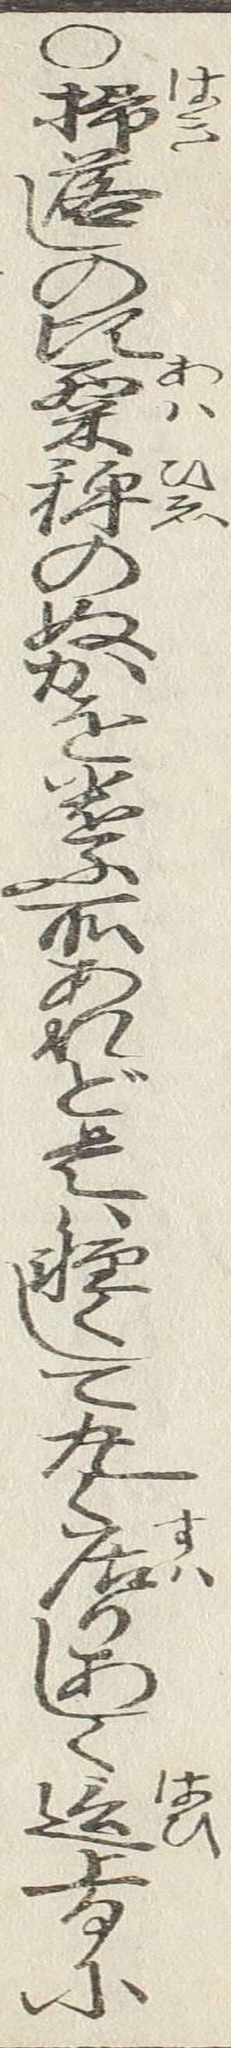○掃落しの頃粟稗のぬかを遣ふ所あれど是は軽くして丸く居りあしく這上るに
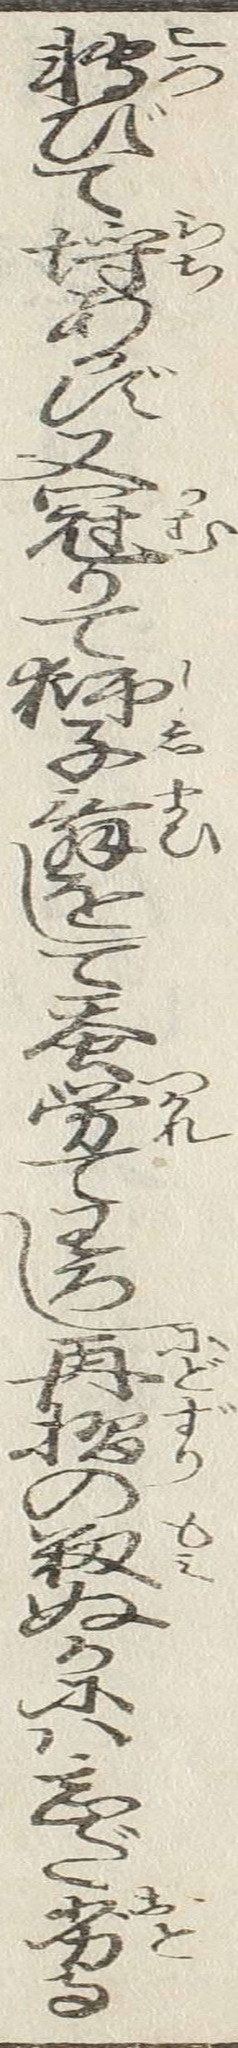転びて埒あかず又冠りて獅子舞をして蚕労てわろし再摺の籾ぬかには甚だ劣る
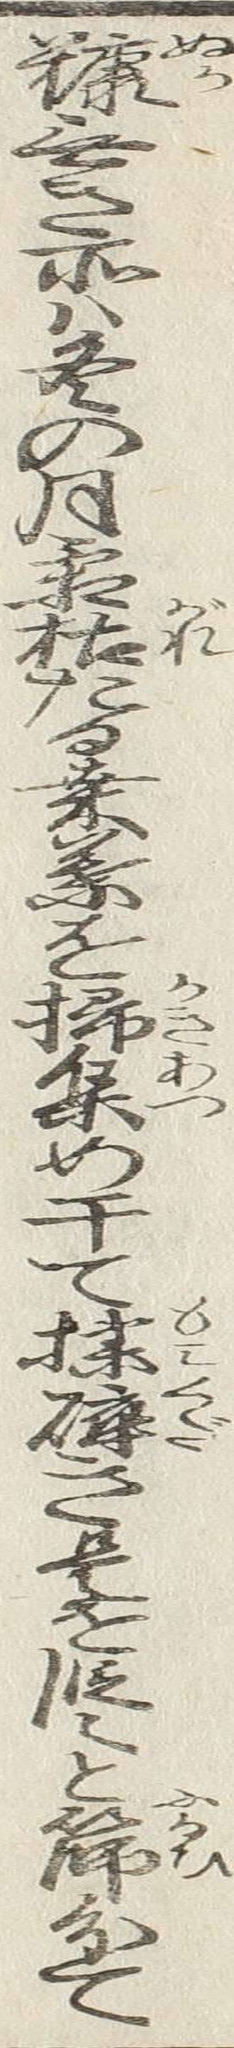糠無き所は冬の月霜枯たる桒葉を掃集め干て揉碎き是を段々と篩分て
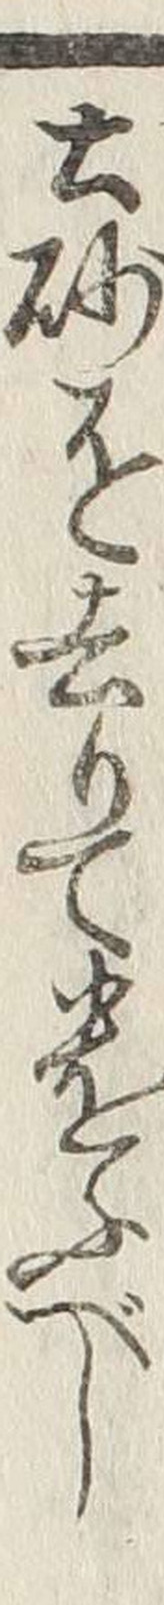土砂を去りて遣ふべし
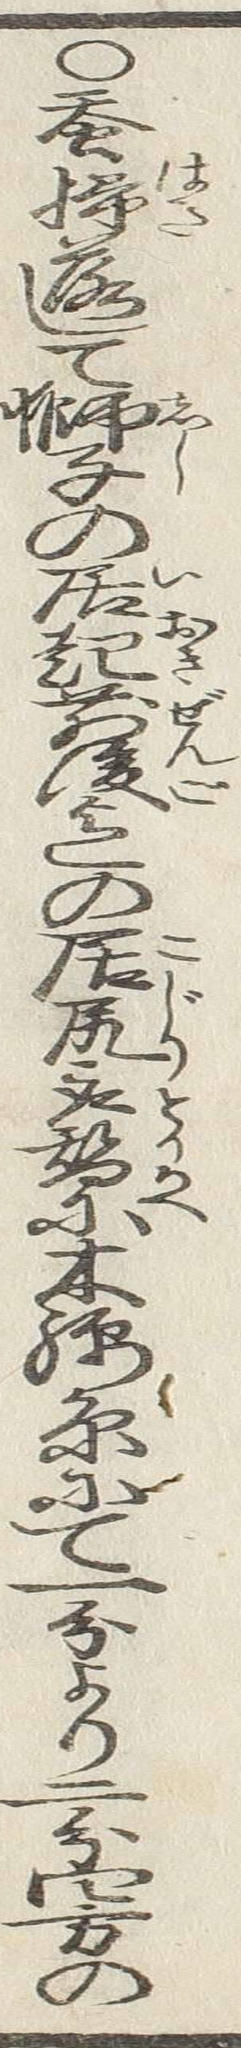○蚕掃落して獅子の居起前後迄の居尻取替に木綿糸にて一分より二分四方の
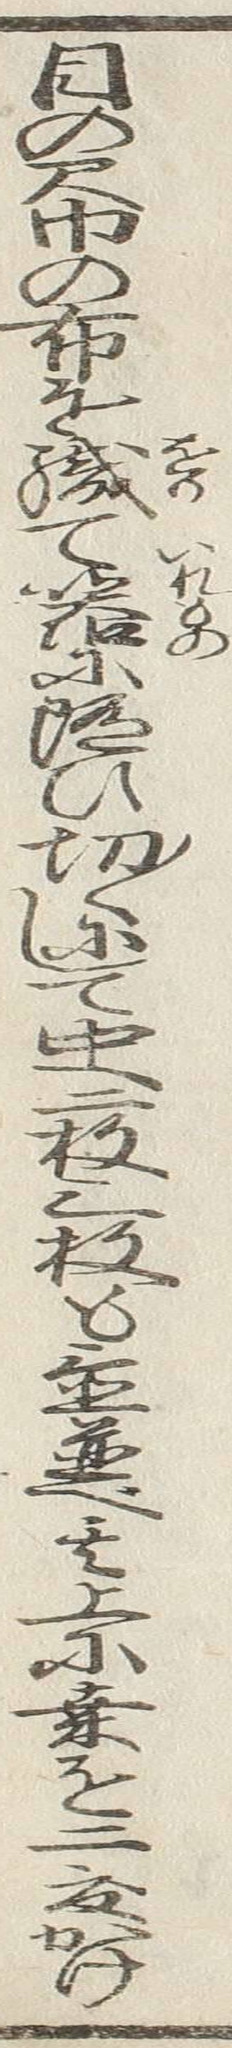目の尺巾の布を織て器に随ひ切〳〵にして中へ二枚三枚も置並べ其上に桒を二度かけ
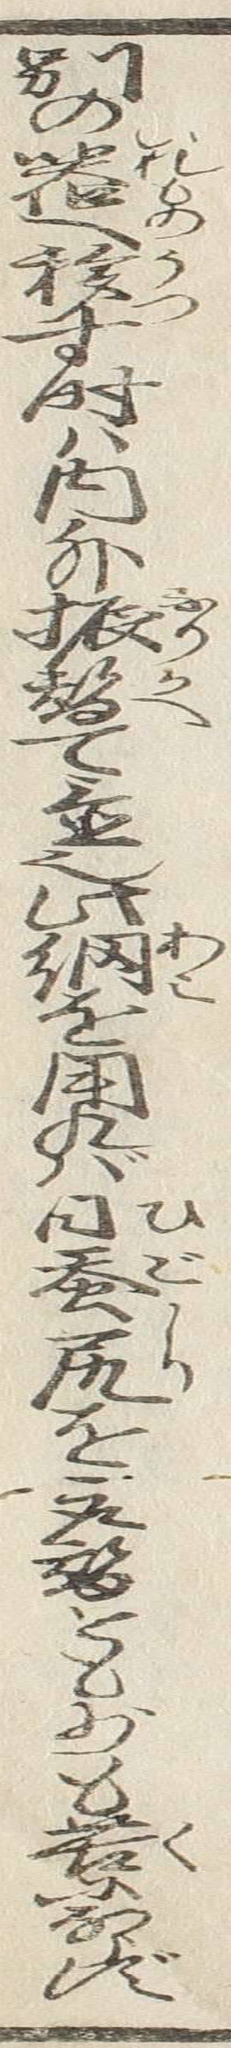別の器へ移す時は内外振替て置也此網を用れば日蚕尻を取替とも少も苦にならず

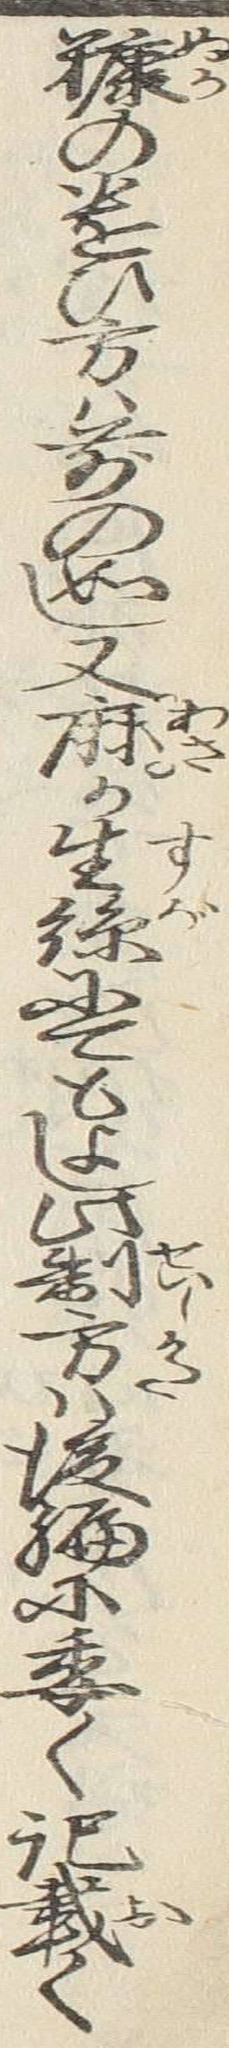糠の遣ひ方は前の如し又麻。か生糸にてもよし此制方は後編に委く記載く
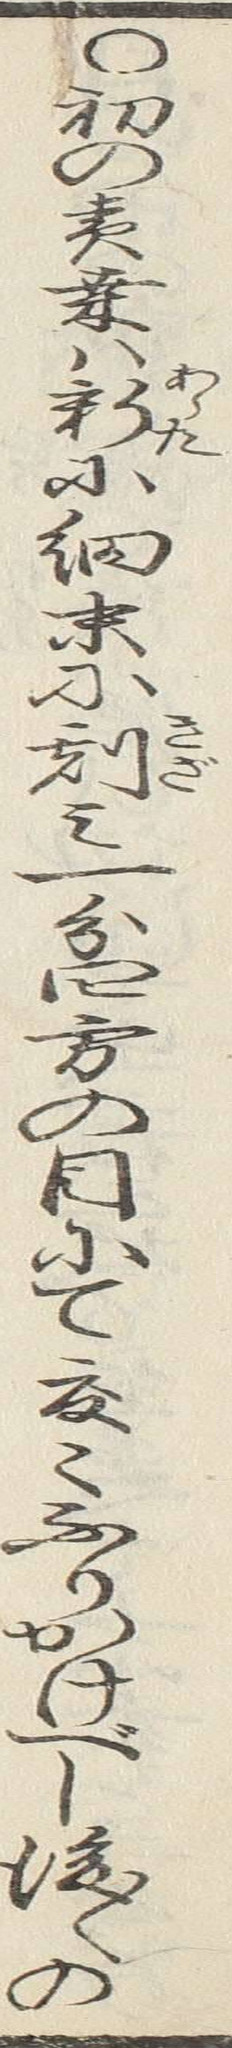○初の責桒は新に細末に刻み一分四方の目にて度々ふりかけべし後〳〵の
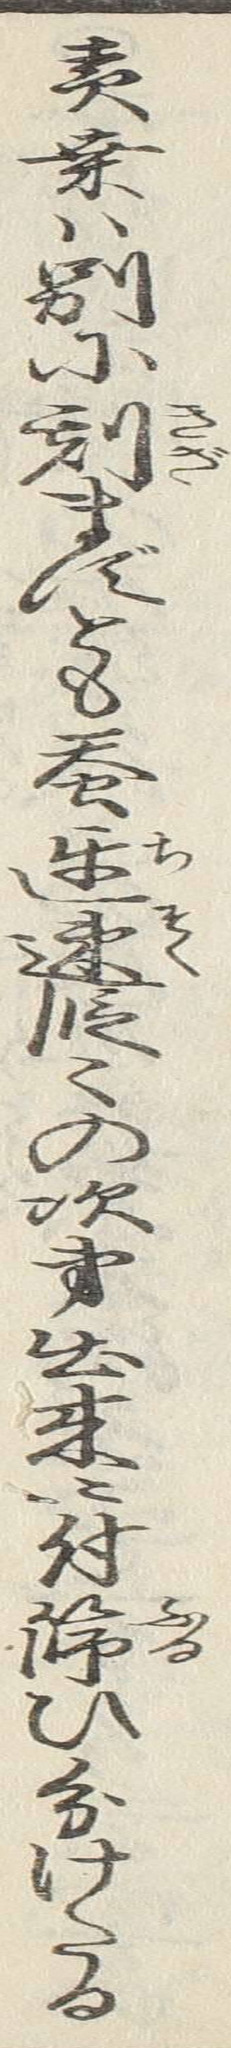責桒は別に刻まずとも蚕遅速段々の次第出来に付篩ひ分けたる
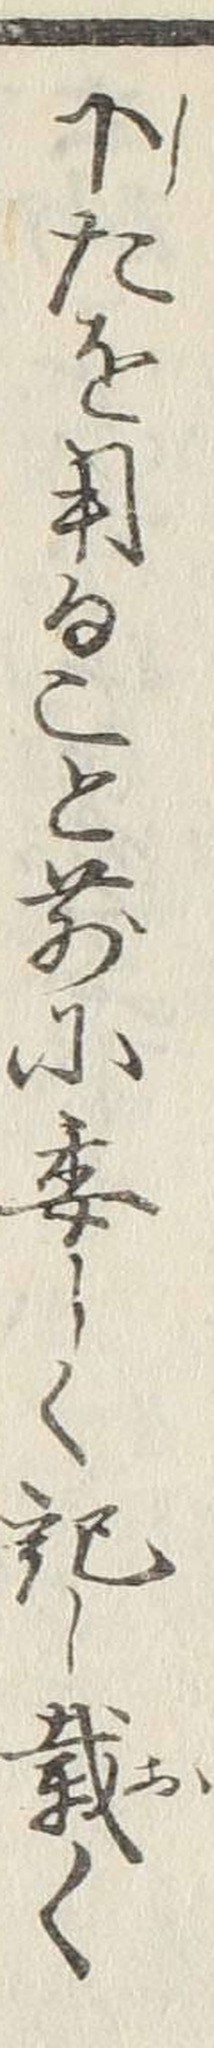下たを用ること前に委しく記し載く
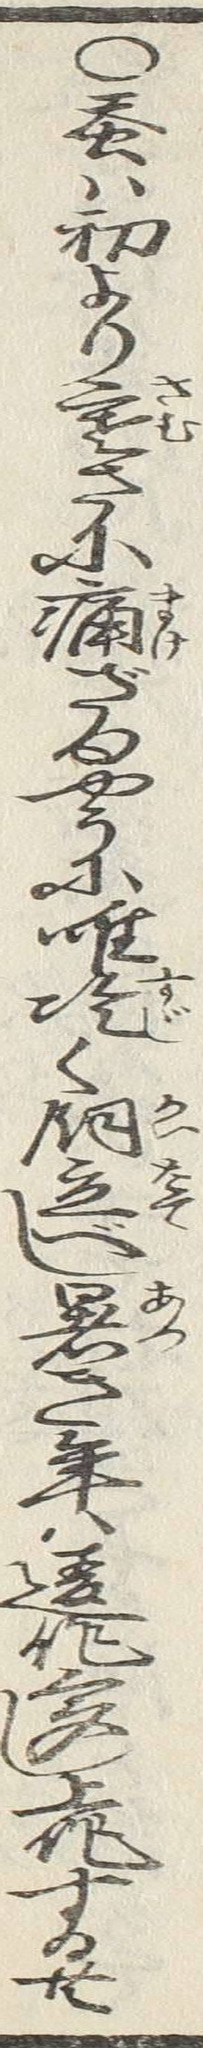○蚕は初より寒さに痛ざるやうに唯冷く飼立べし暑き年は違作多し上作する共
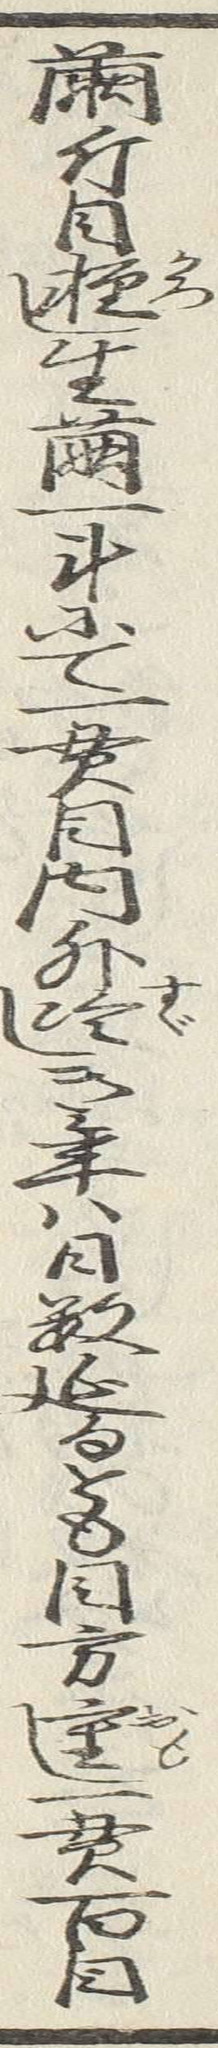繭斤目軽し生繭一斗にて一貫目内外冷しき年は日数延るとも目方重し一貫百目
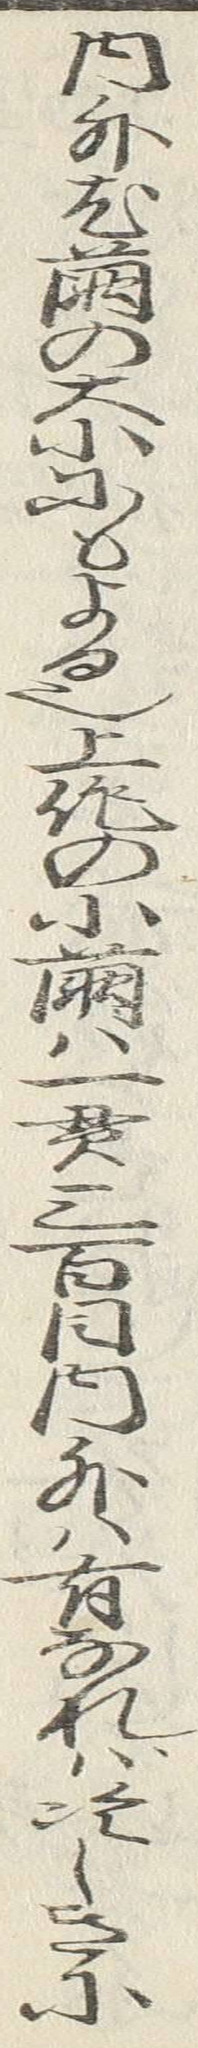内外尤繭の大小にもよる也上作の小繭は一貫三百目内外は有なれば冷しきに
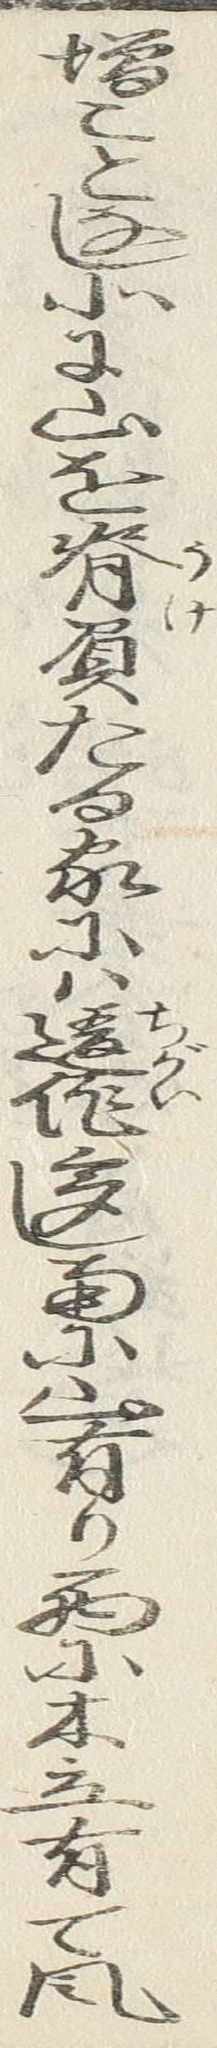増ことなし北に山を脊負たる家には違作多し南に山有り西に木立有て風
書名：養蠶實驗録
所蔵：東京大学農学生命科学図書館 国文学研究資料館
